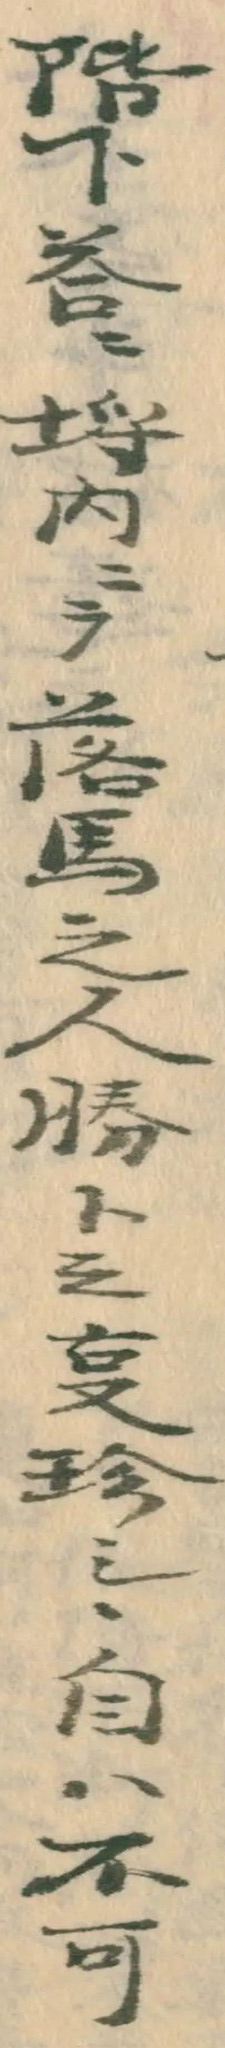階下答ニ将内ニテ落馬之人勝ト云事珍シヽ自ハ不可
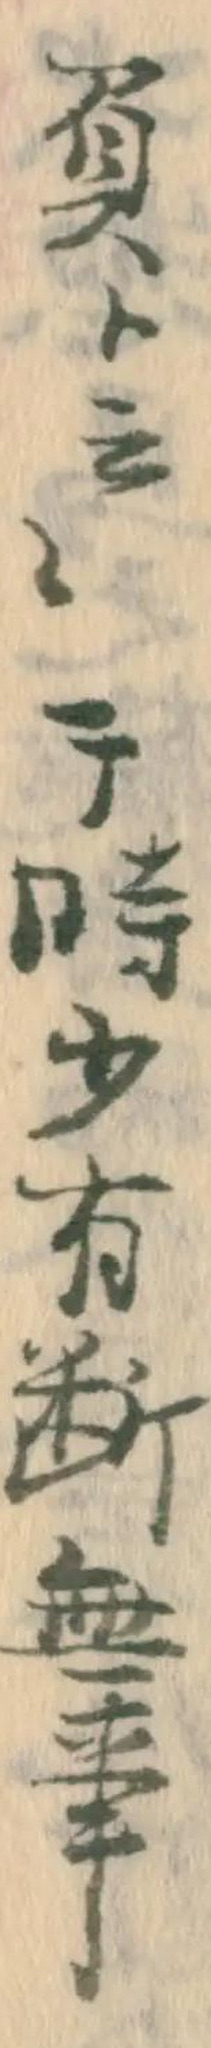負ト云々于時少有断無事

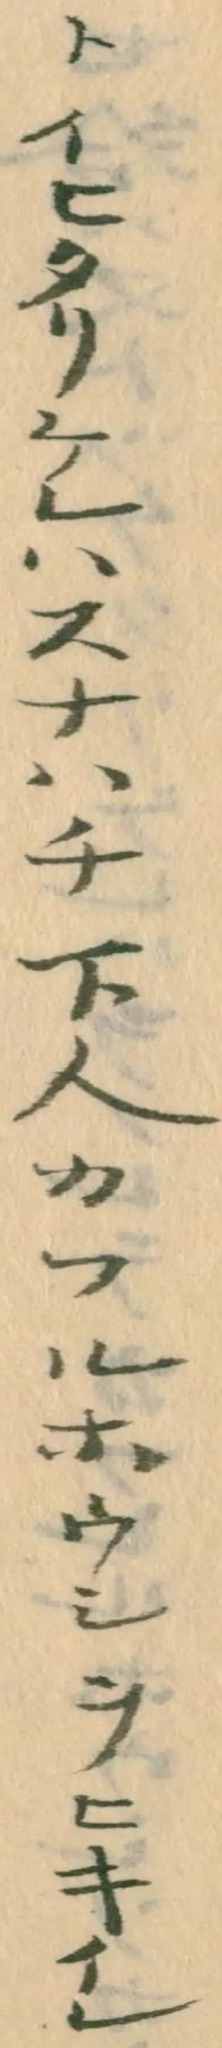トイヒタリケレハスナハチ下人カフルホウシヲヒキイレ
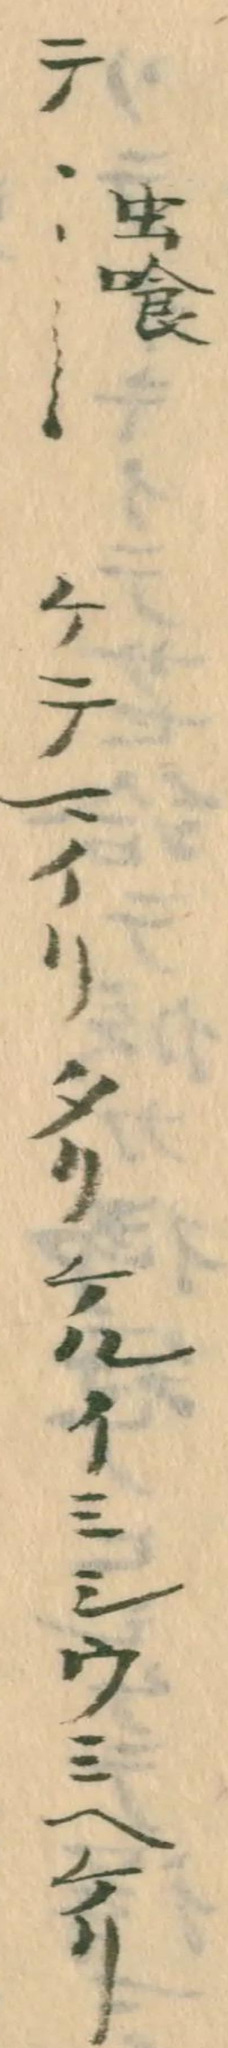テケテマイリタリケルイミシウミへケリ
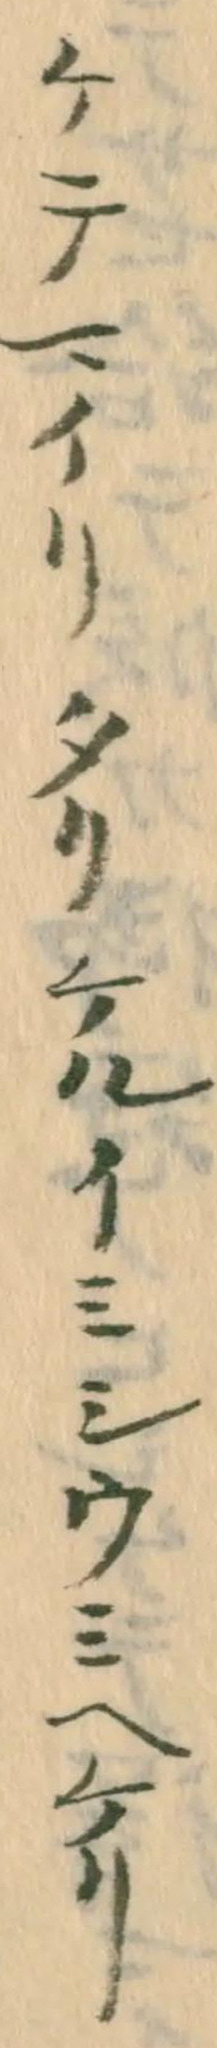テケテマイリタリケルイミシウミへケリ
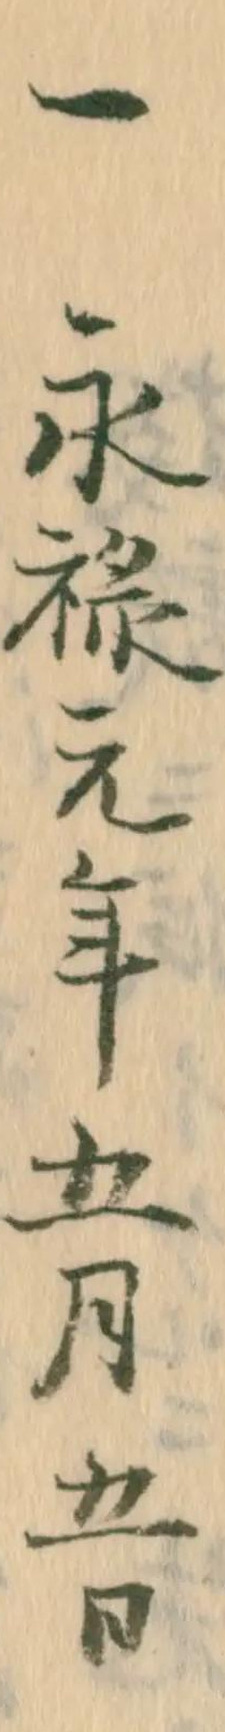一永禄元年五月五日
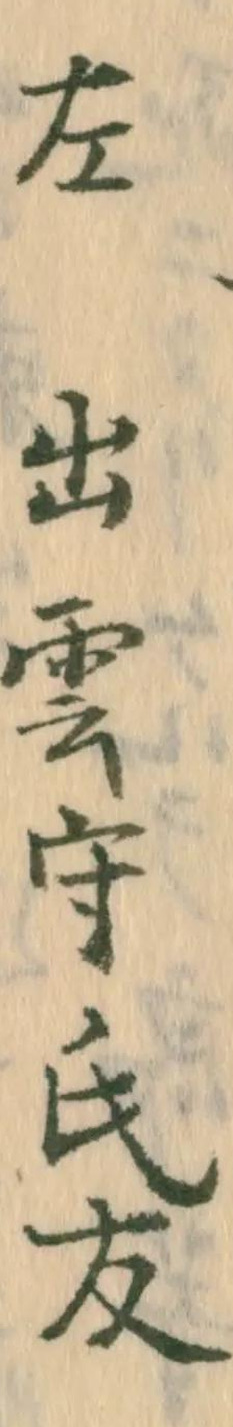左出雲守氏友
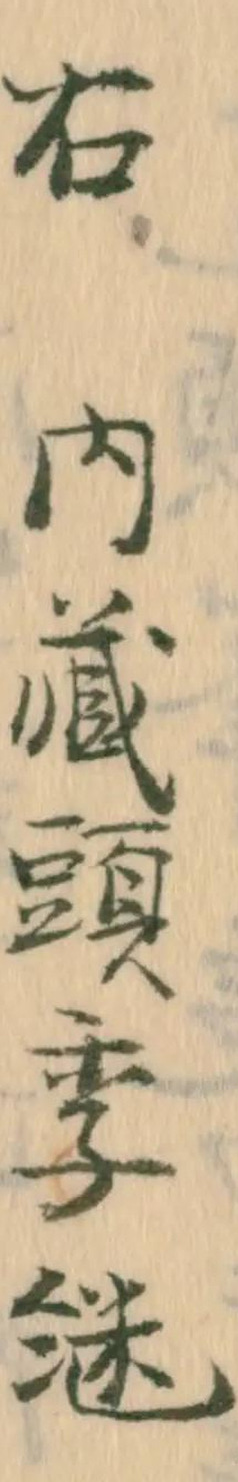右内蔵頭季継
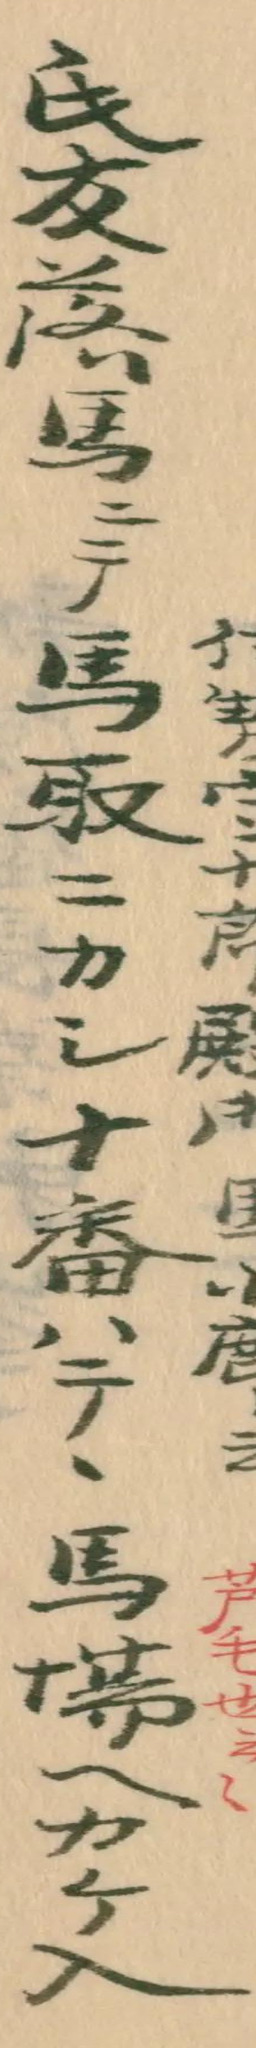氏友落馬ニテ馬取ニカシ十番ハテヽ馬場へカケ入
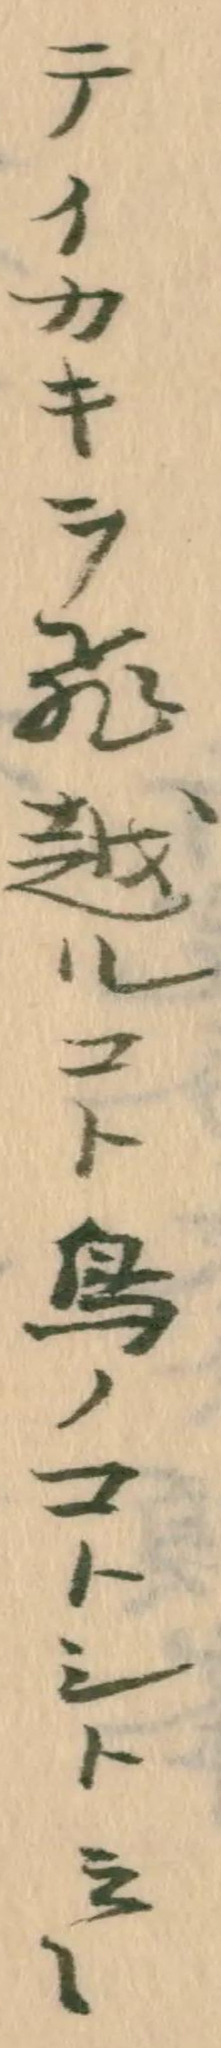テイカキヲ飛越ルコト鳥ノコトシト云々
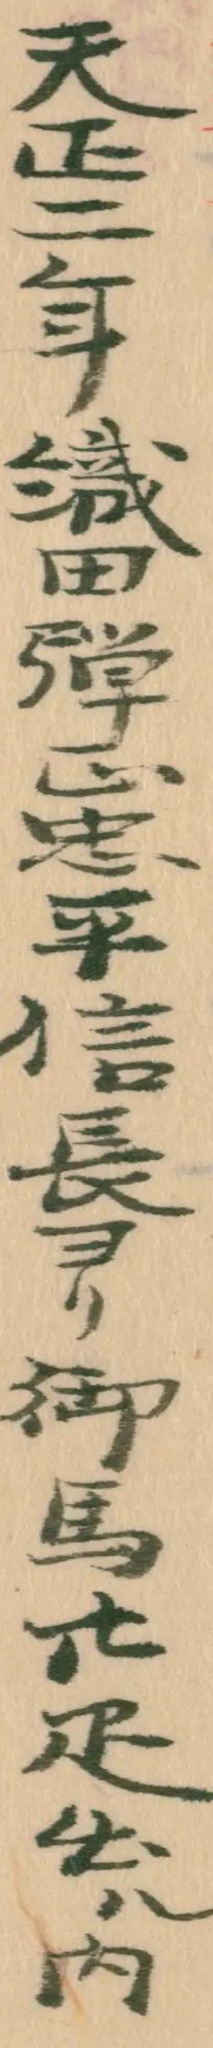一天正二年織田弾正忠平信長ヨリ御馬廿疋出ル内
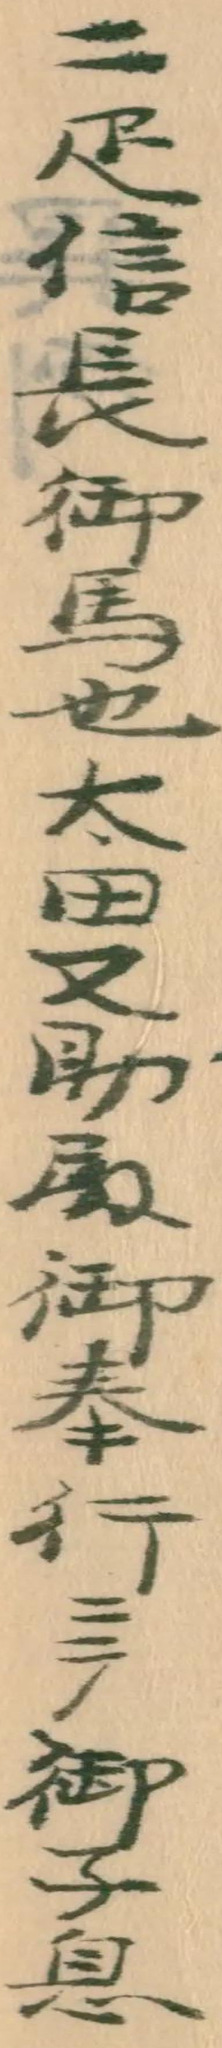二疋信長御馬也太田又助殿御奉行ニテ御子息
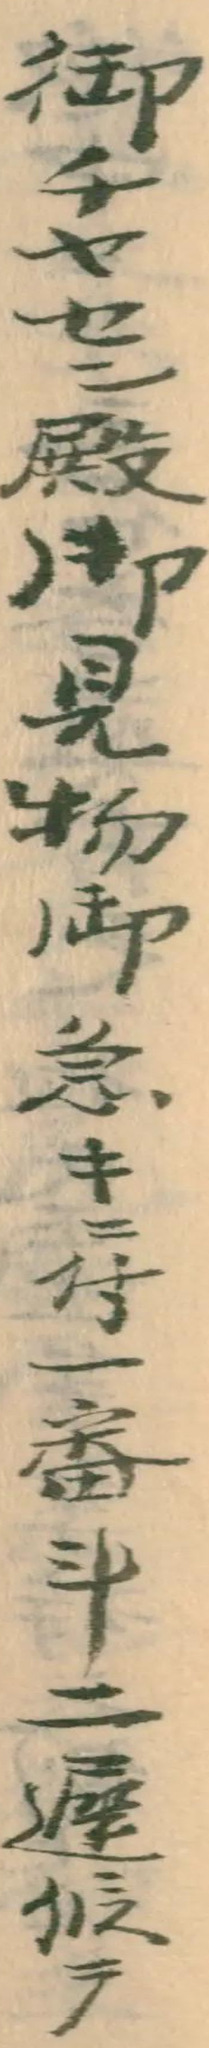御チヤセン殿御見物御急キニ付一番計二遅候テ
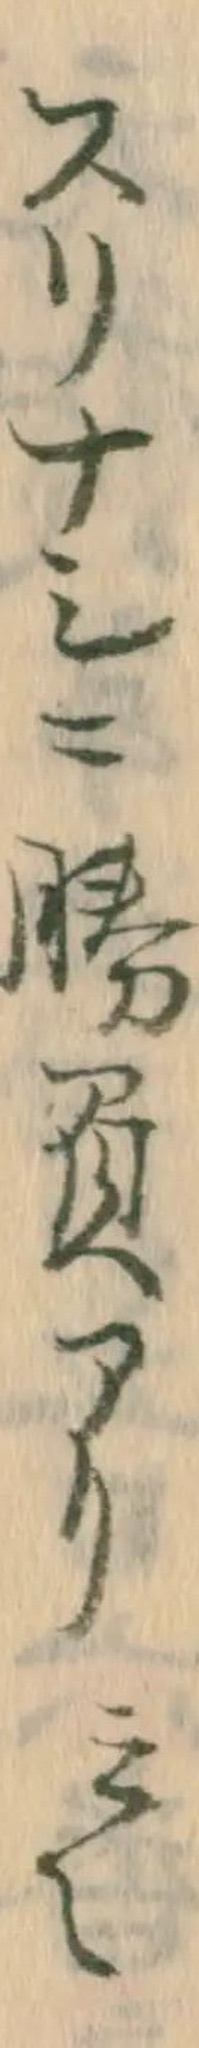スリナシニ勝負アリ云々
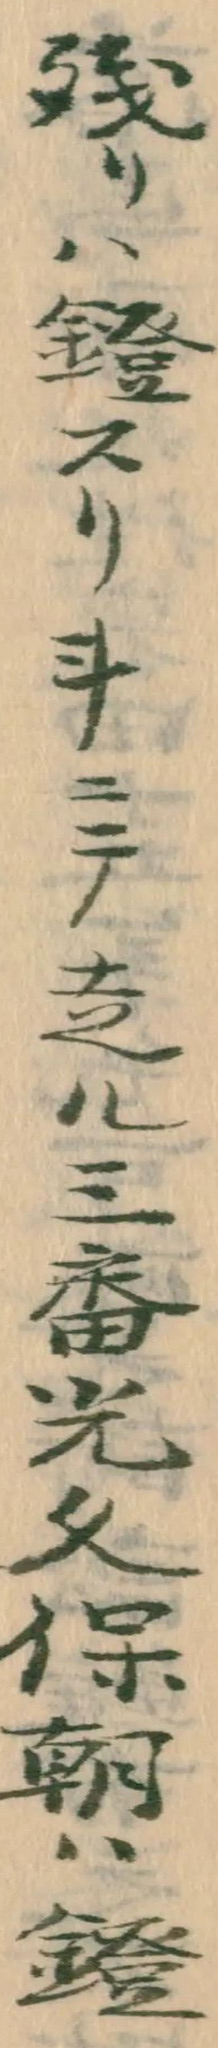残リハ鐙スリ計ニテ走ル三番光久保朝ハ證
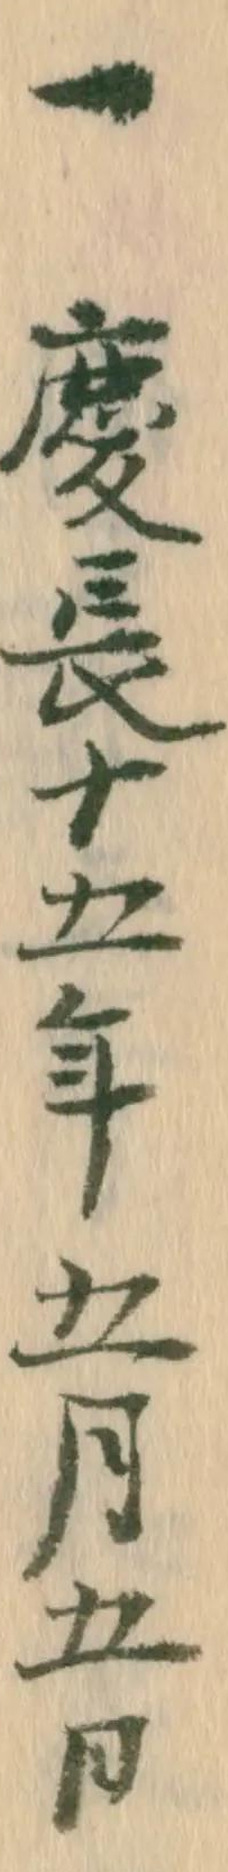一慶長十五年五月五日
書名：賀茂社記録. 第12冊
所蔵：国立国会図書館 National Diet Library, JAPAN
